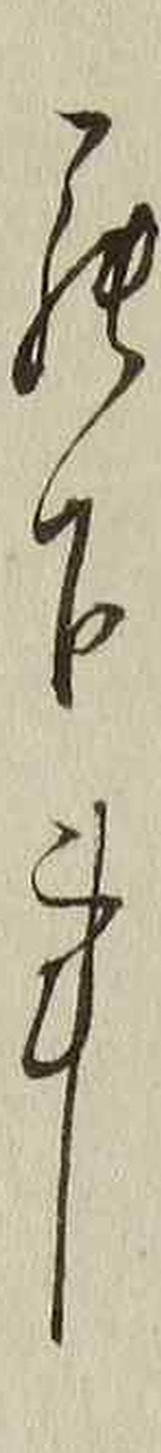罷下事
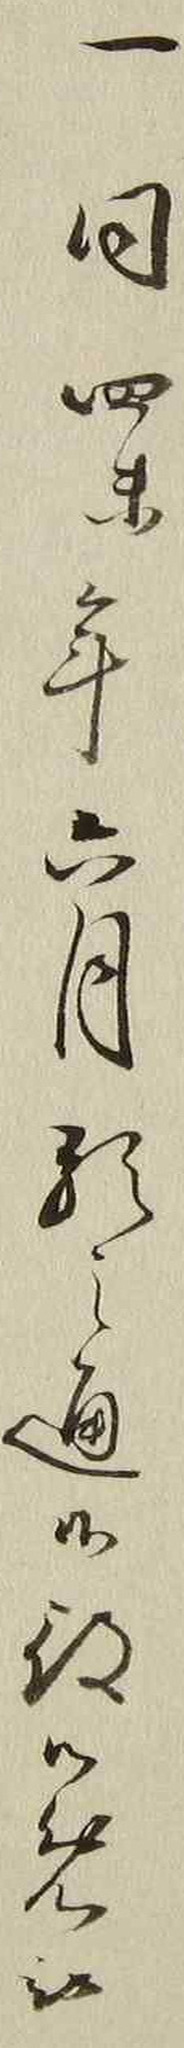一同四未年六月願之通御役御免被
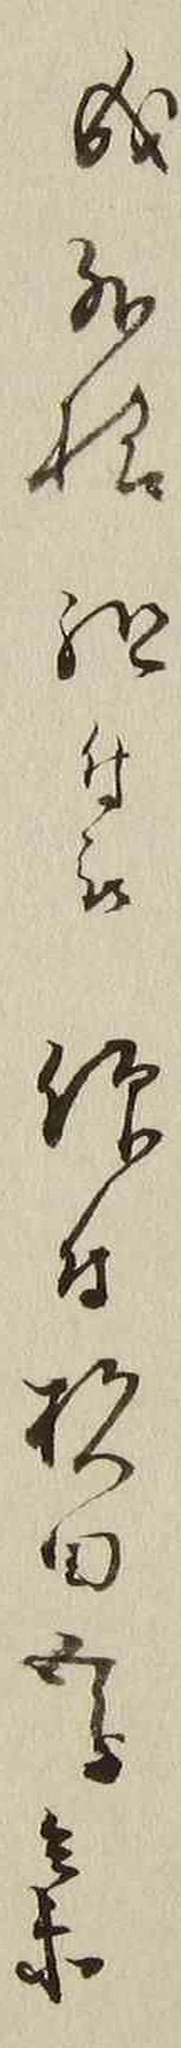成外様組付被仰付杉田五郎兵衛
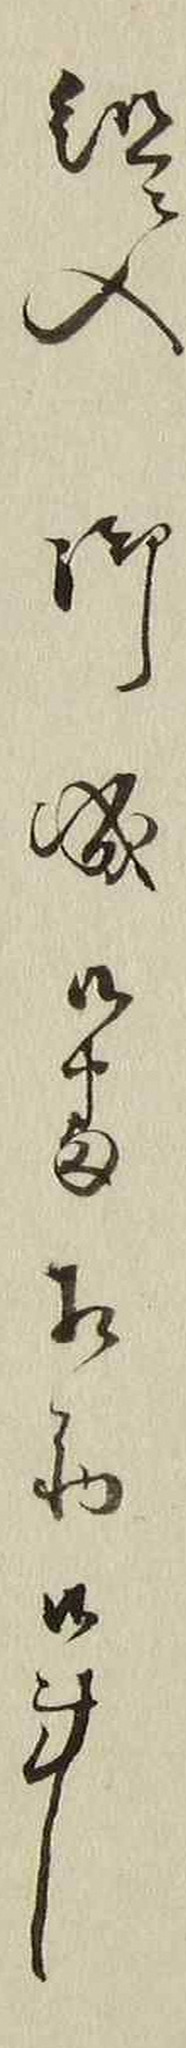組ニ入御城御番相勤候事
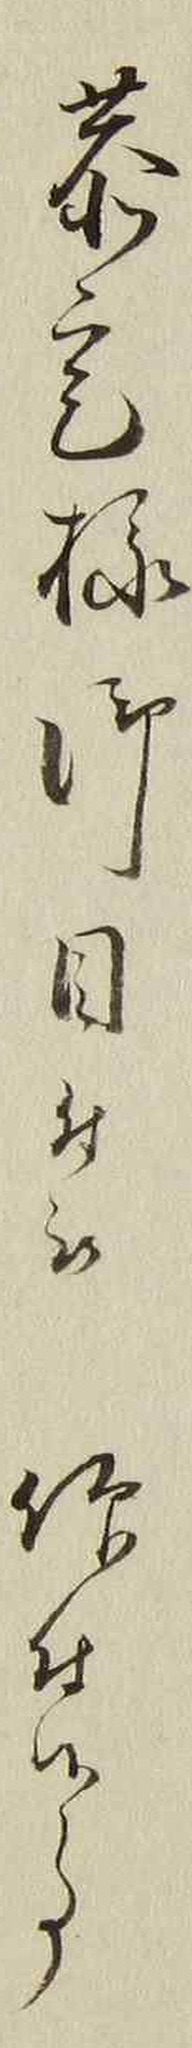恭定様御目付被仰付候事
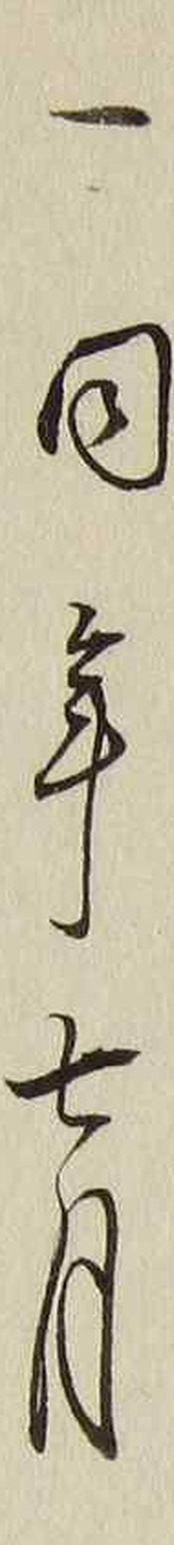一同年七月
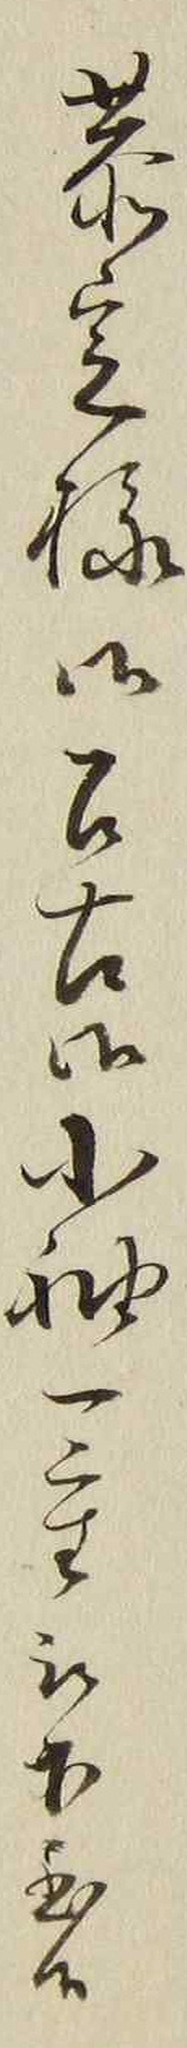恭定様御召古御小袖一重被下置候

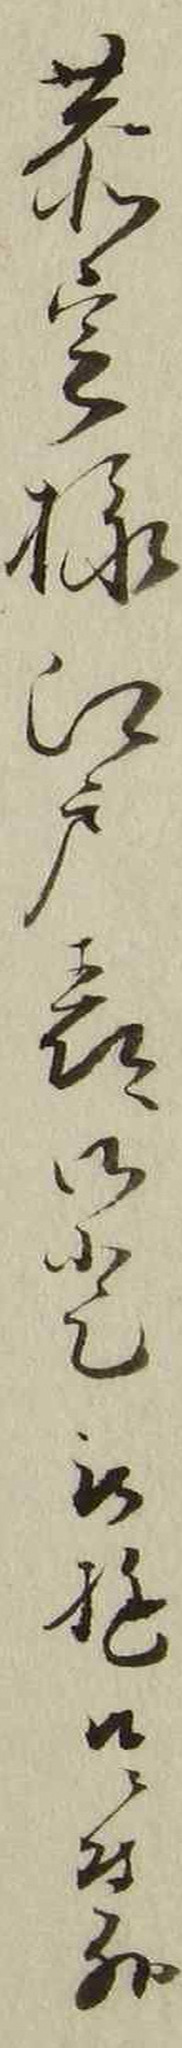恭定様江戸表へ御登被遊候ニ付外
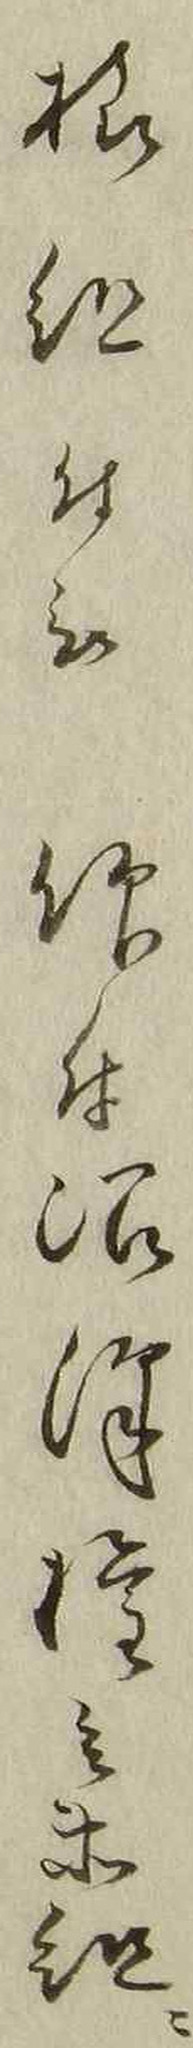様組付被仰付沼澤権兵衛組ニ
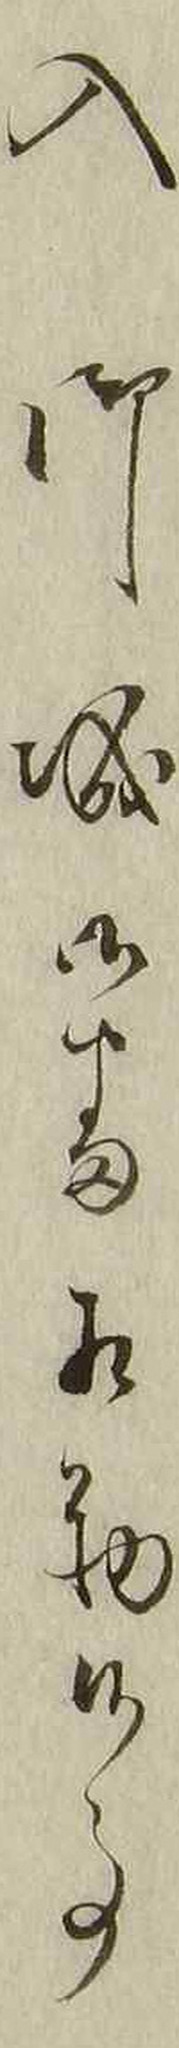入御城御番相勤候事
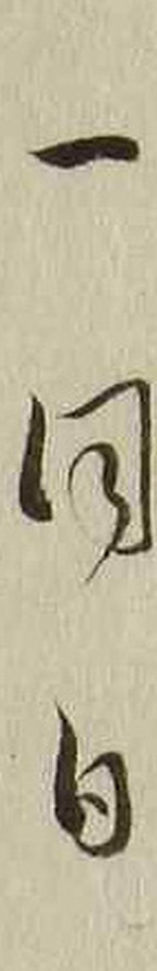一同日
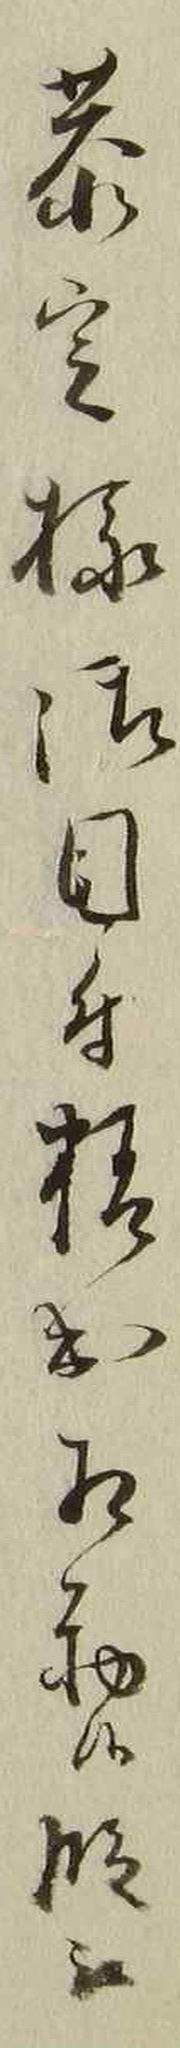恭定様御目付精出相勤候段被
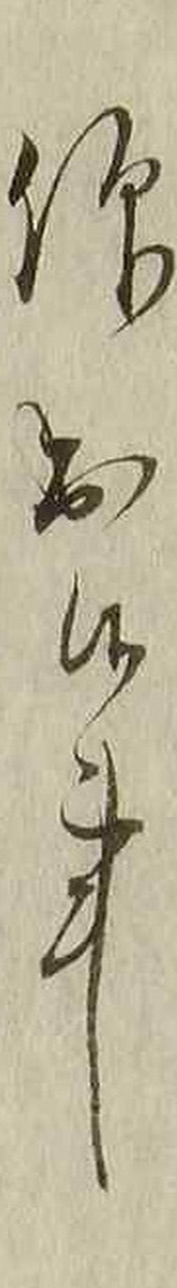仰出候事
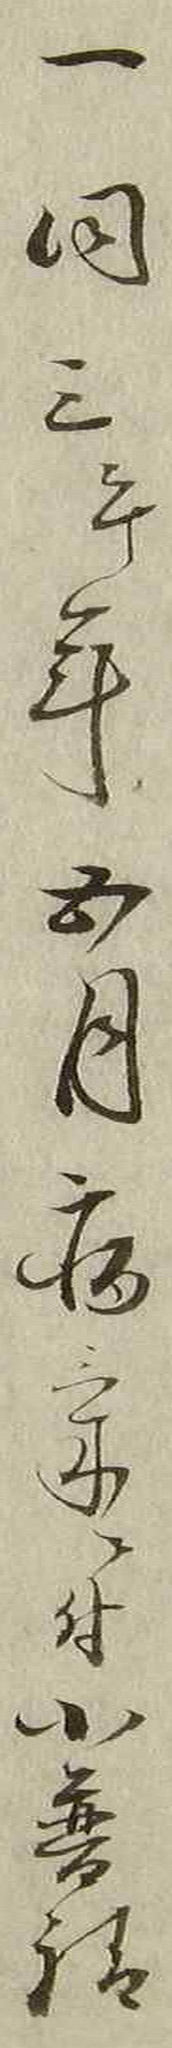一同三午年五月病気ニ付小普請
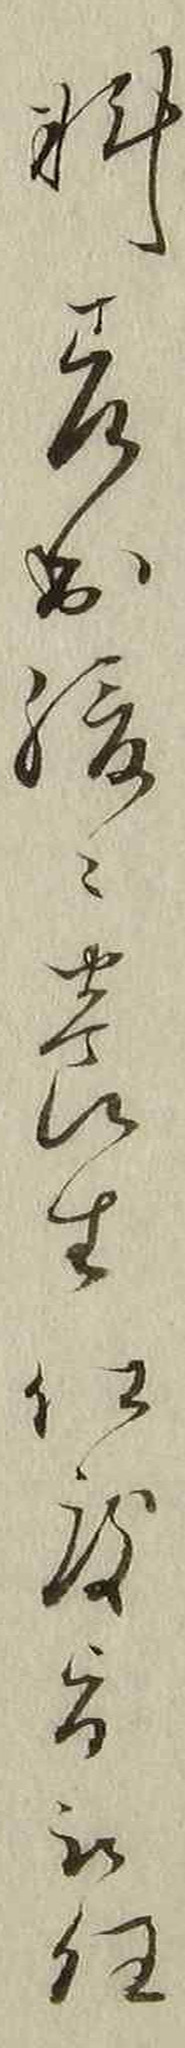料差出緩々養生仕度旨被任
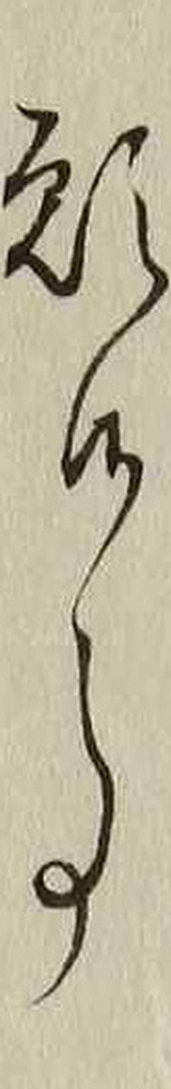願候事
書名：諸士系譜　巻之129　た之部5
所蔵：会津若松市立会津図書館
